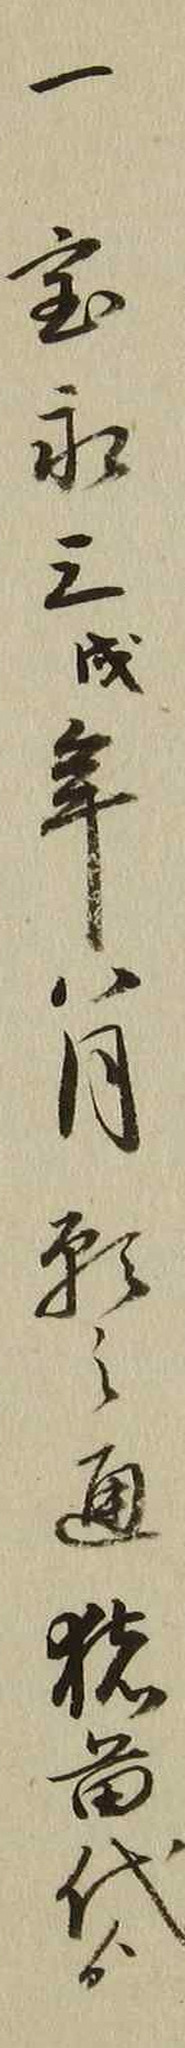一宝永三戌年八月願之通猪苗代ゟ
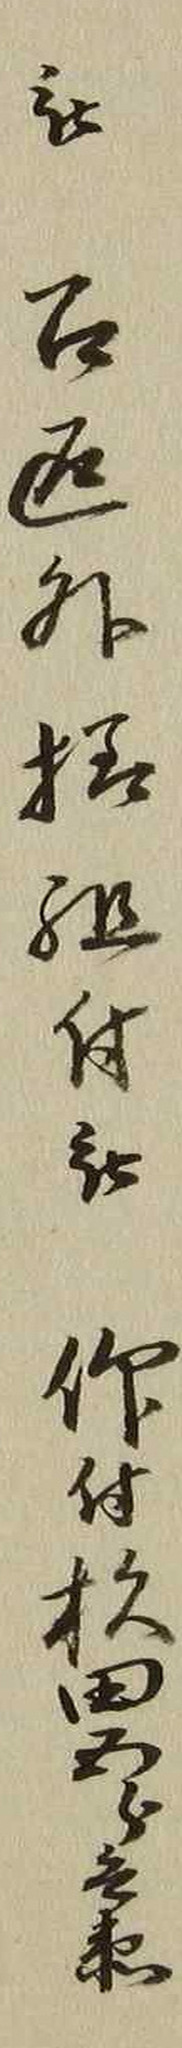被召返外様組付被仰付杉田五郎兵衛
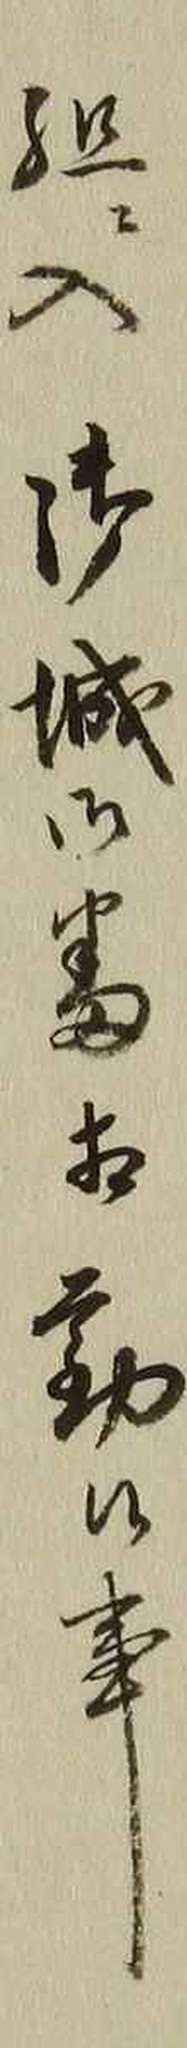組ニ入御城御番相勤候事
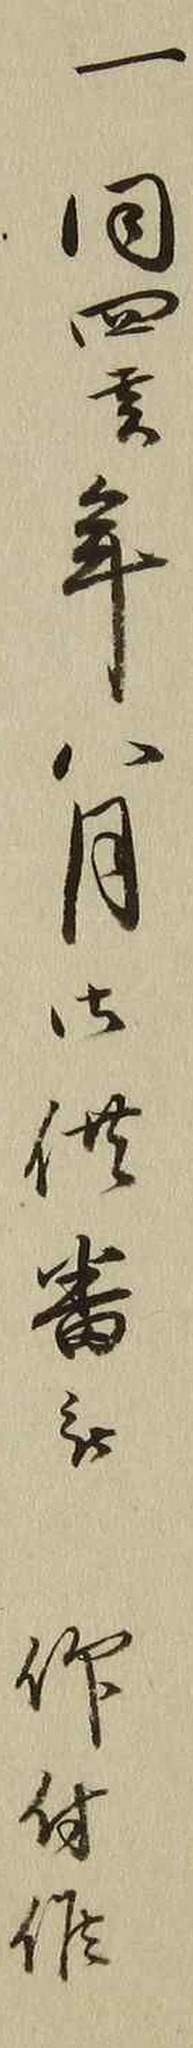一同四亥年八月御供番被仰付候
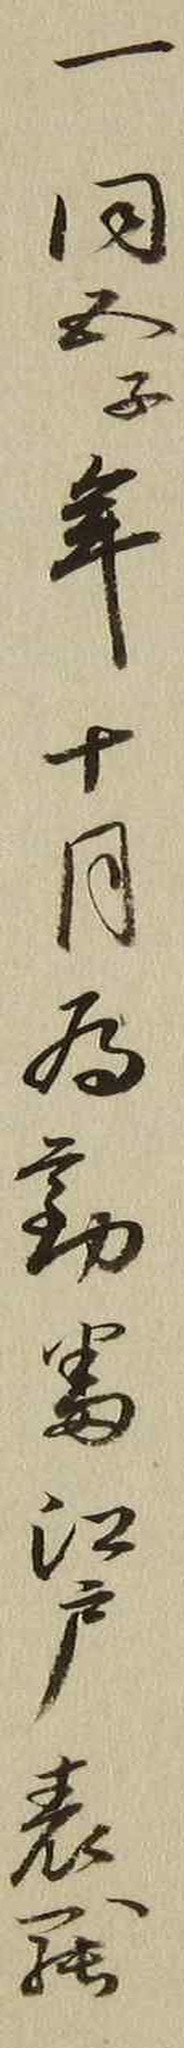一同五子年十月為勤番江戸表罷
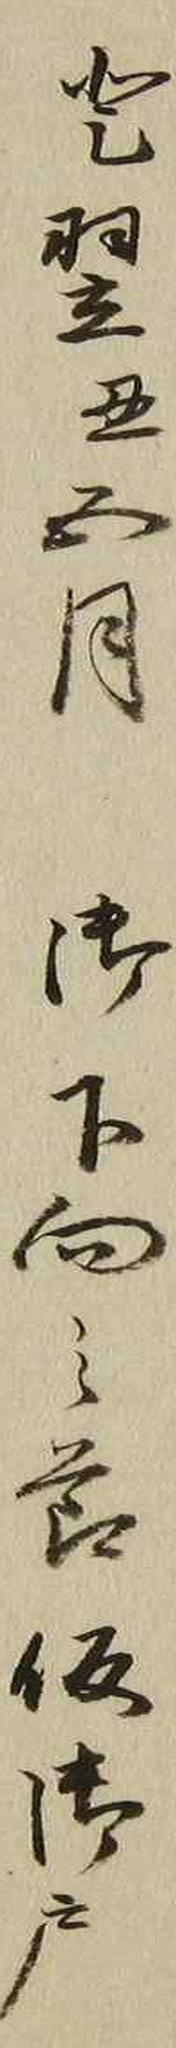登翌丑五月御下向之節仮御戸
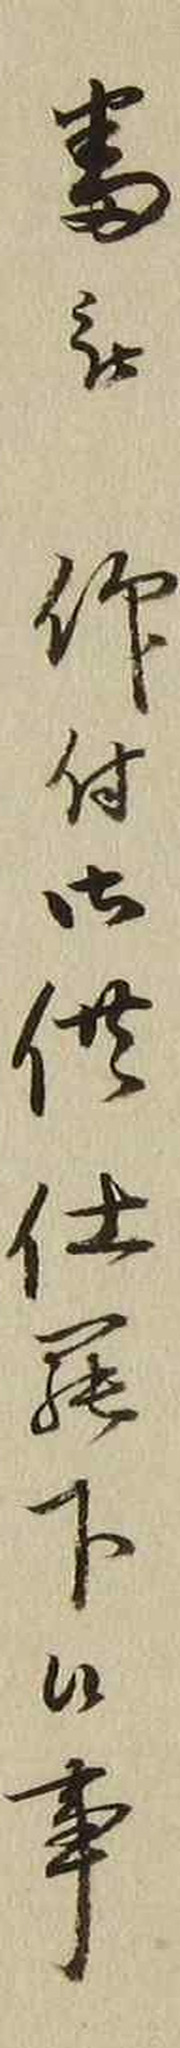番被仰付御供仕罷下候事
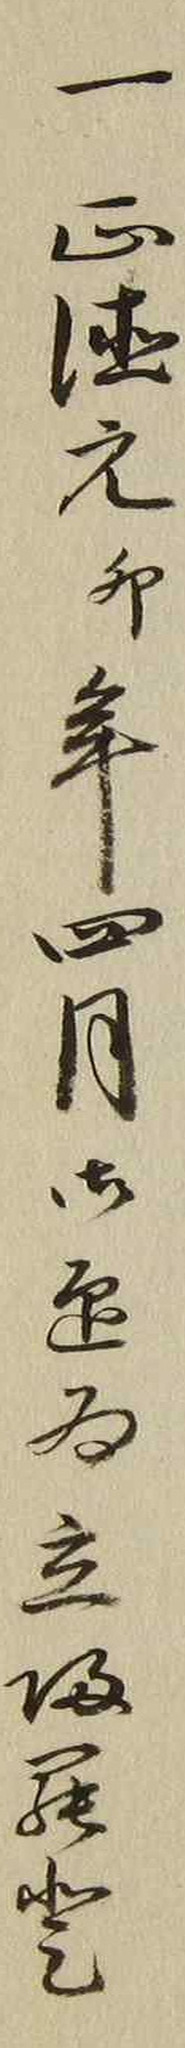一正徳元卯年四月御迎為立帰罷登
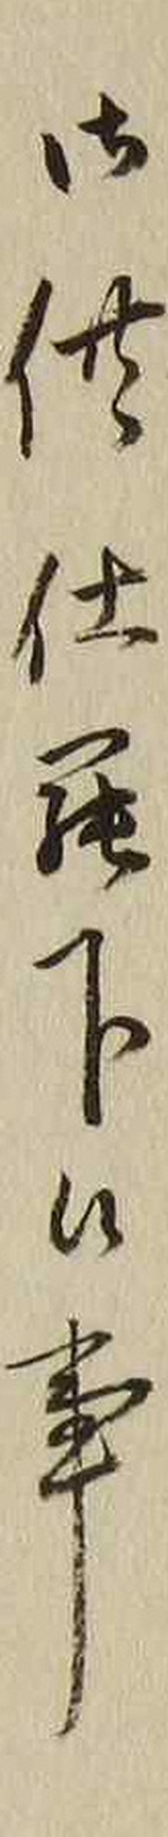御供仕罷下候事
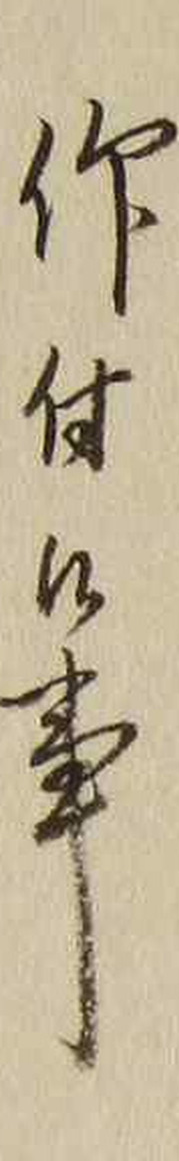仰付候事
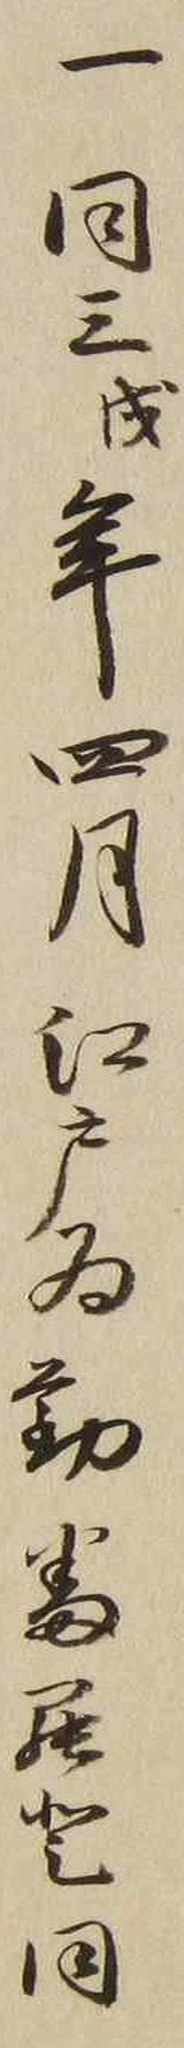一同三戌年四月江戸為勤番罷登同

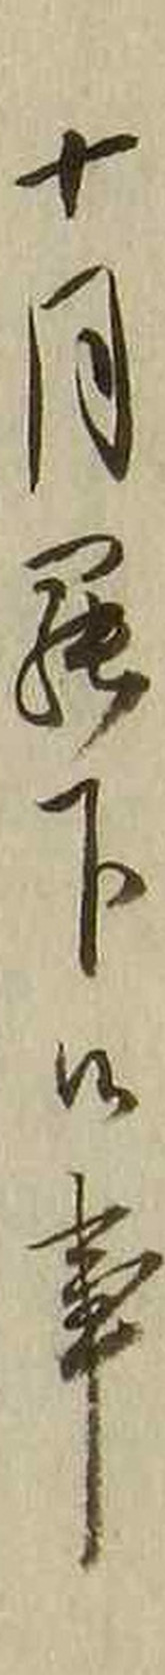十月罷下候事
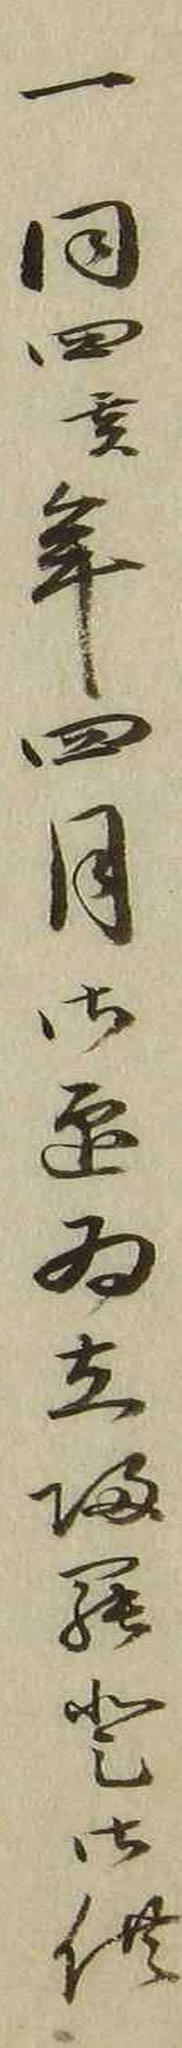一同四亥年四月御迎為立帰罷登御供
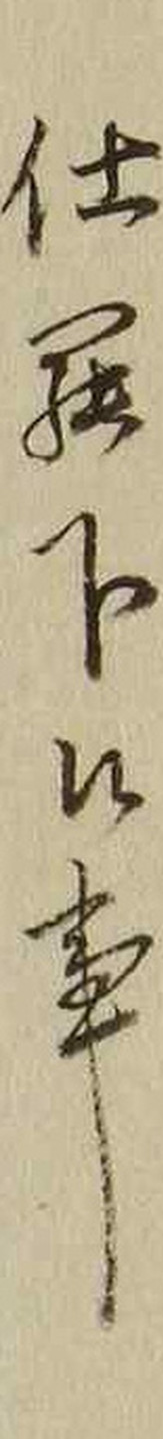仕罷下候事
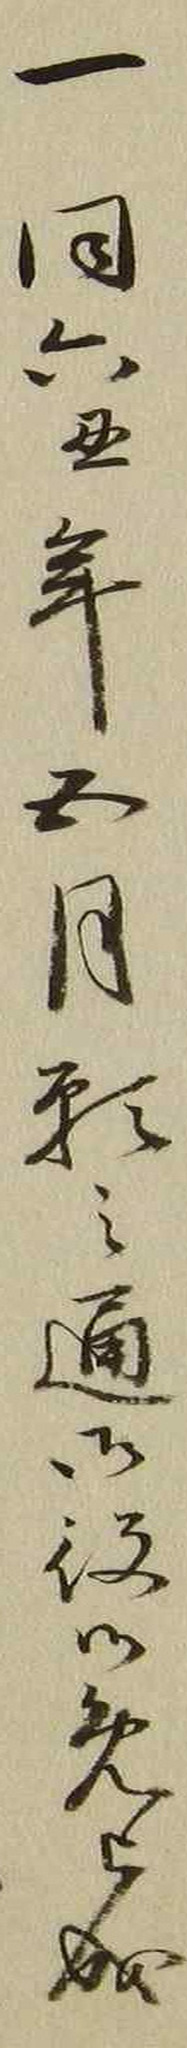一同六丑年五月願之通御役御免被成
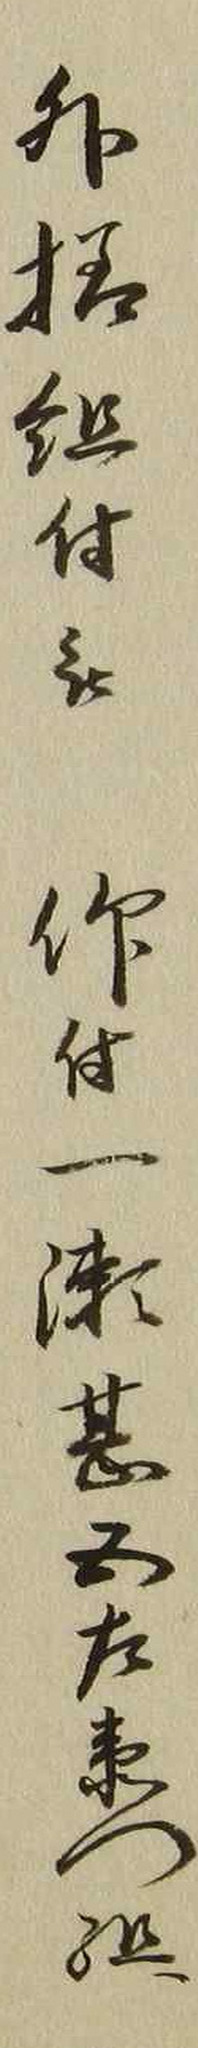外様組付被仰付一瀬甚五左衛門組へ
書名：諸士系譜　巻之128　た之部4
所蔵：会津若松市立会津図書館
